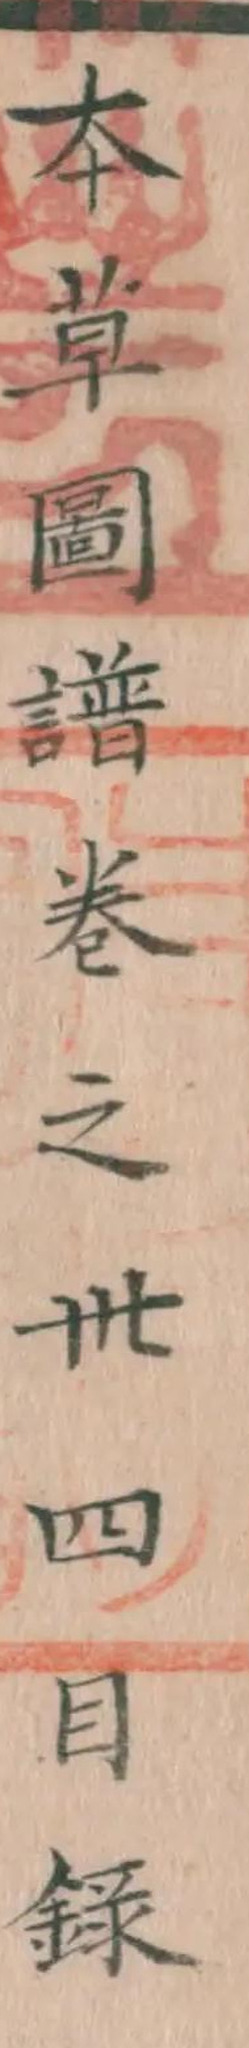本草図譜巻之卅四目録
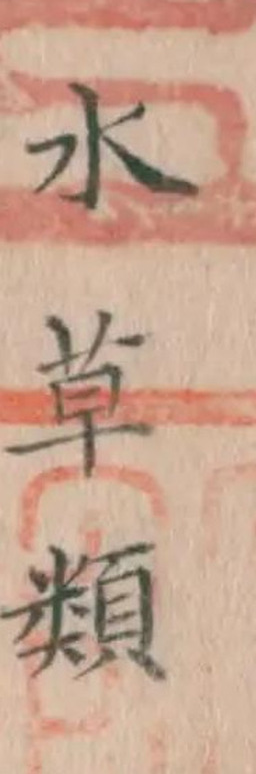水草類

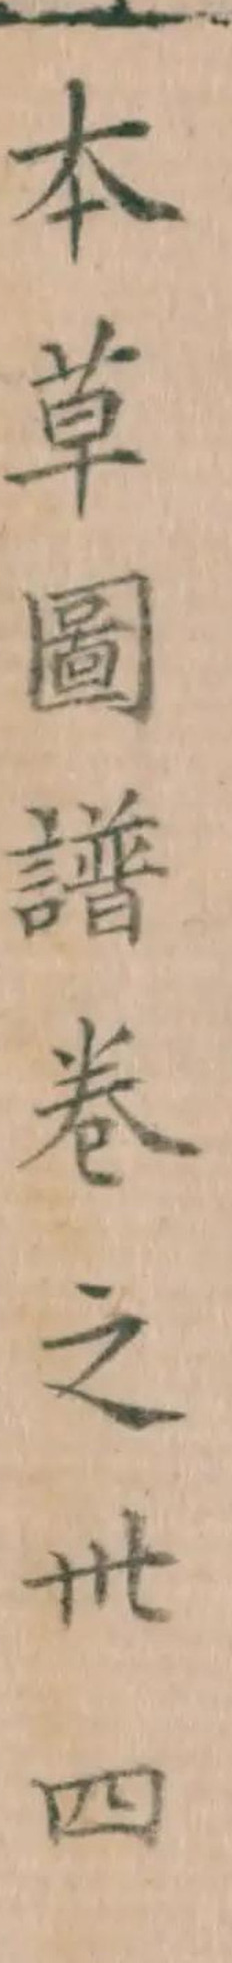本草図譜巻之卅四
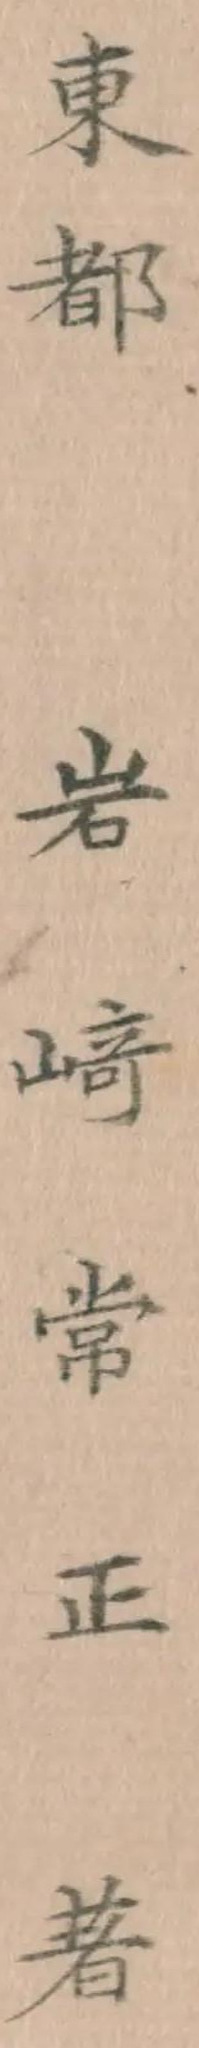東都岩崎常正著
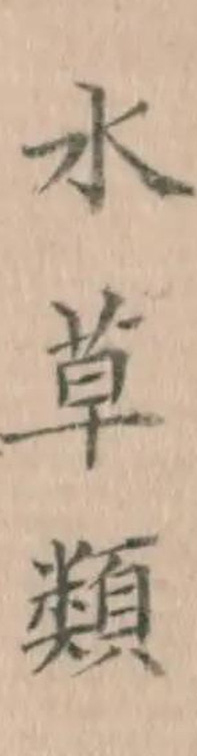水草類

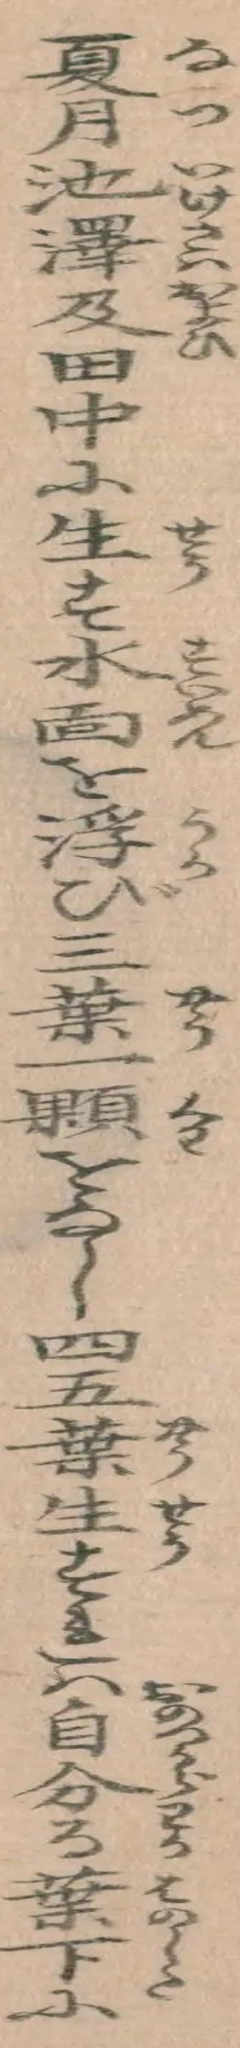夏月池沢及田中に生す水面を浮び三葉一顆をなし四五葉生すれは自分る葉下に
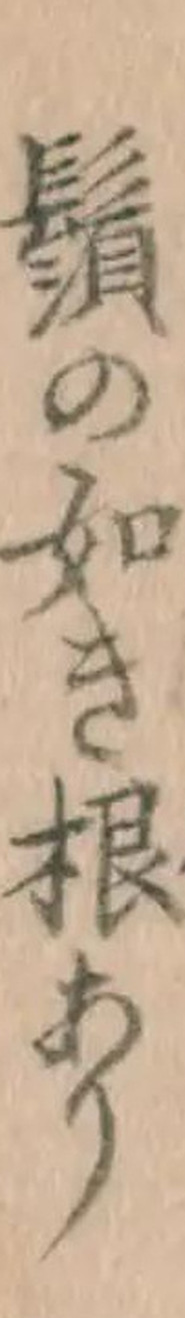鬚の如き根あり
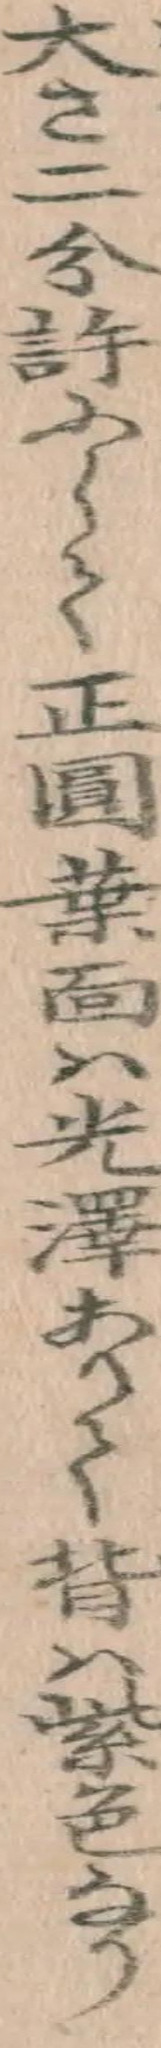大さ二分許にして正円葉面は光沢ありて背は紫色なり

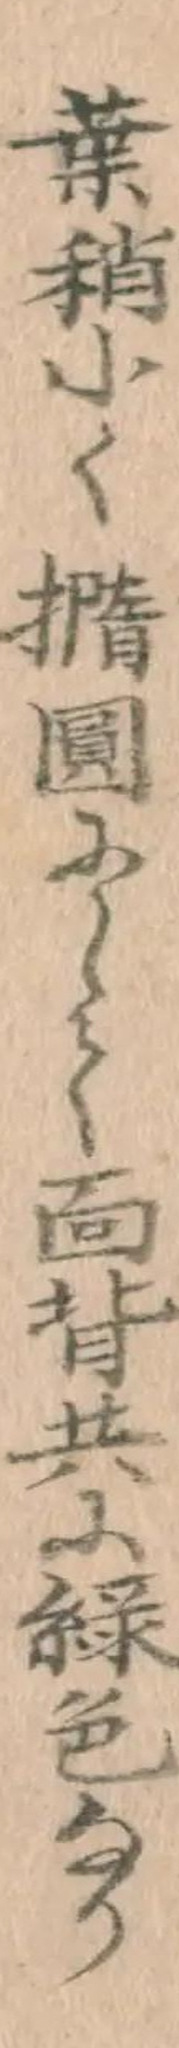葉稍小く撱円にして面背共に緑色なり
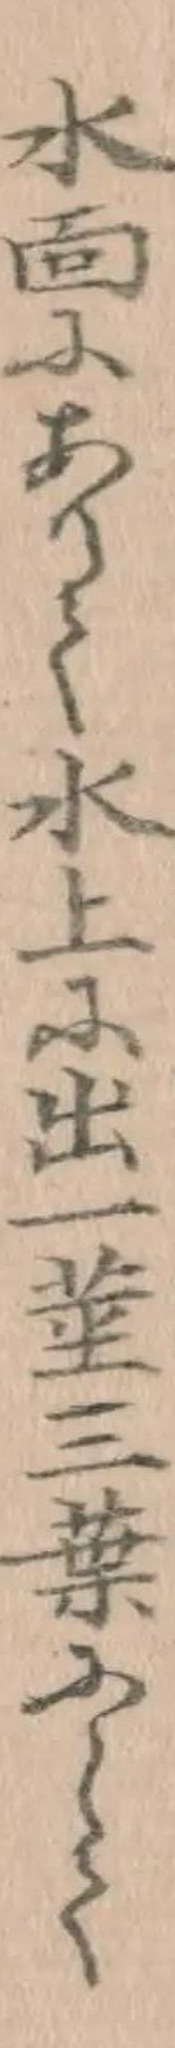水面にありて水上に出一茎三葉にして
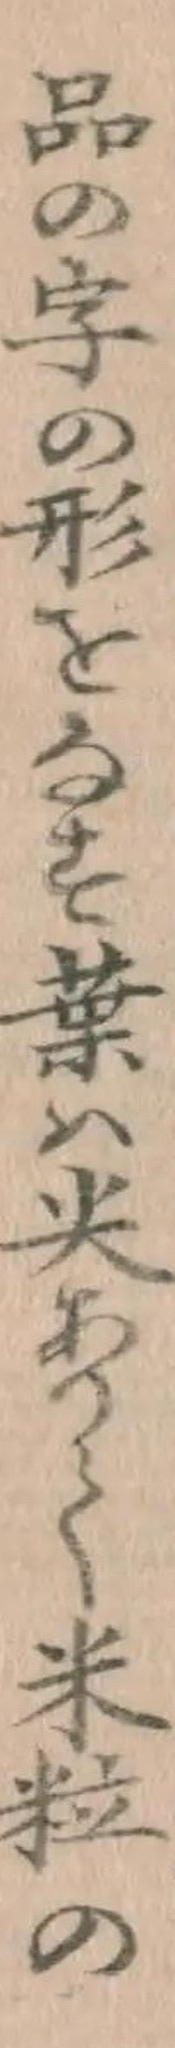品の字の形をなす葉は尖ありて米粒の
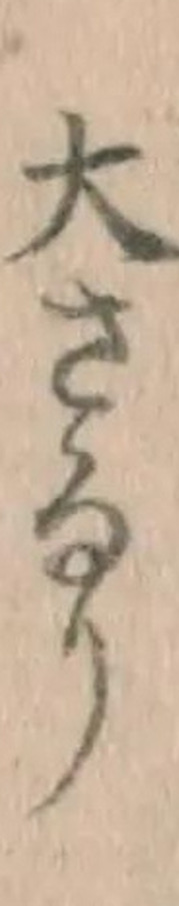大さなり

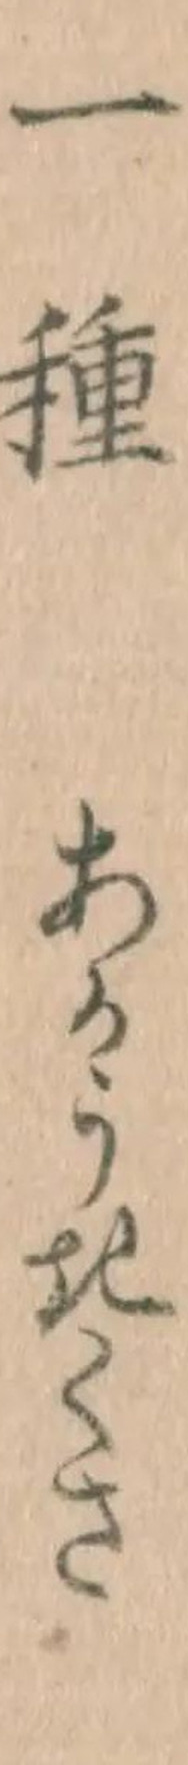一種てふうきくさ
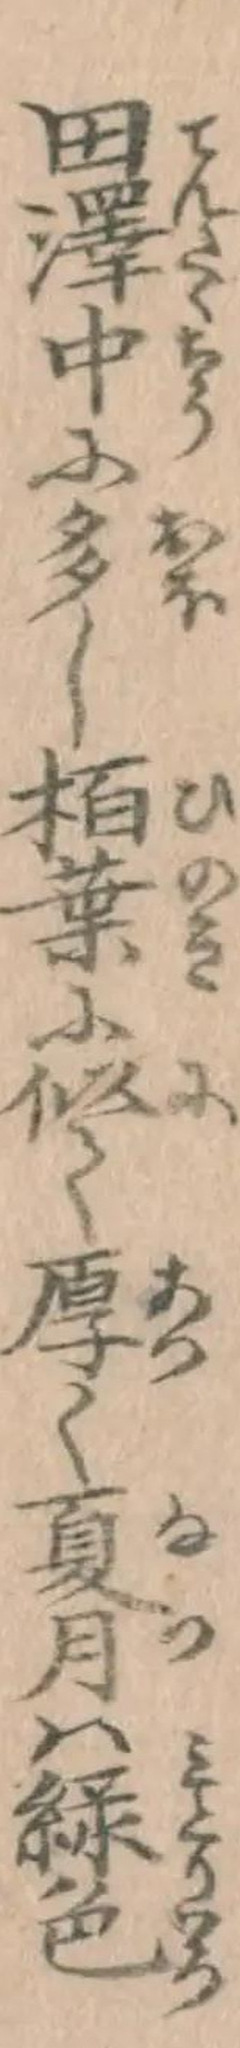田沢中に多し栢葉に似て厚く夏月は緑色
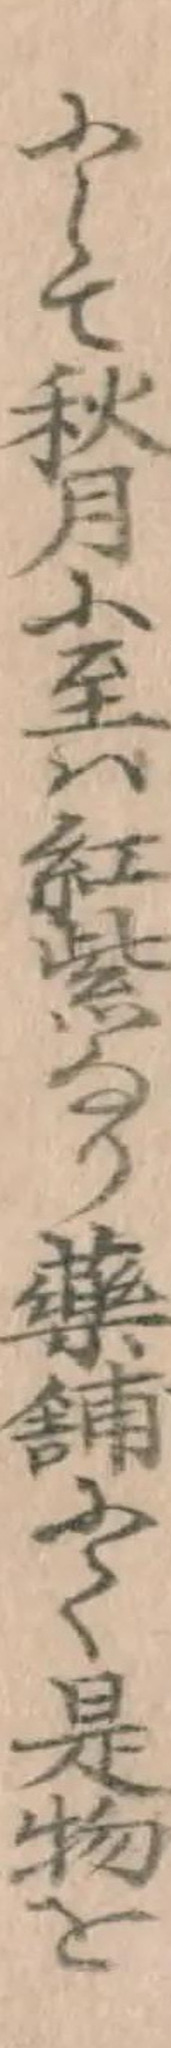にして秋月に至は紅紫なり薬舗にて是物を
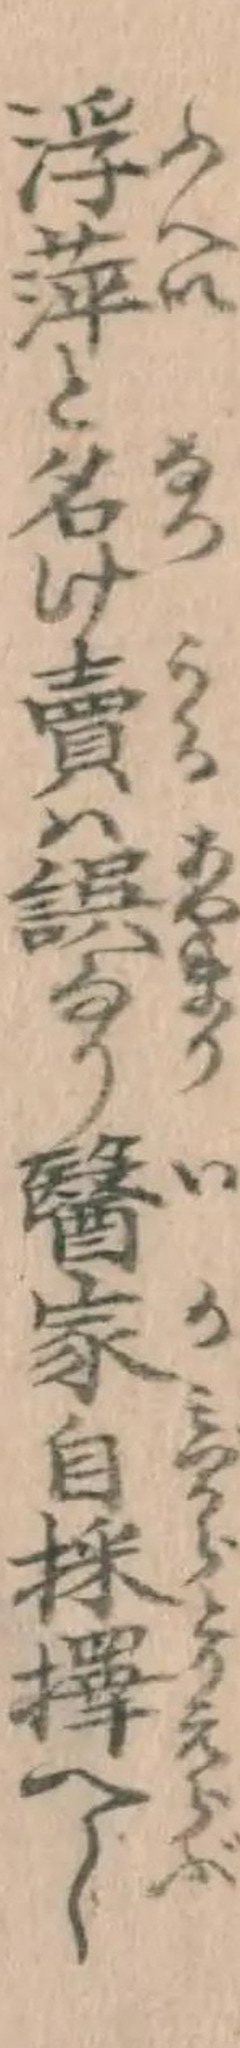浮萍と名け売は誤なり医家自採択へし
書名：本草図譜. 巻34-36
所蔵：国立国会図書館 National Diet Library, JAPAN
